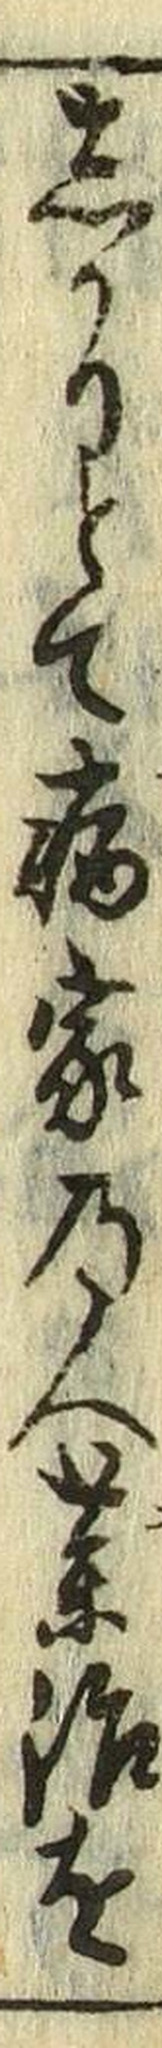しかりとて病家の人薬治を
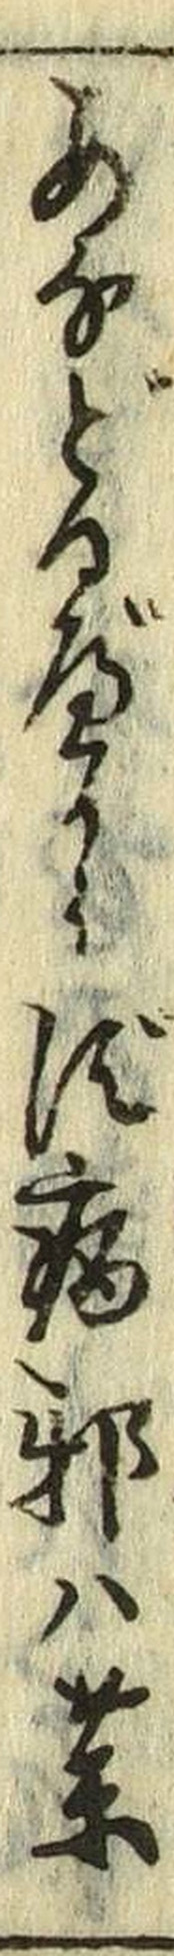あなどるべからず病邪は薬
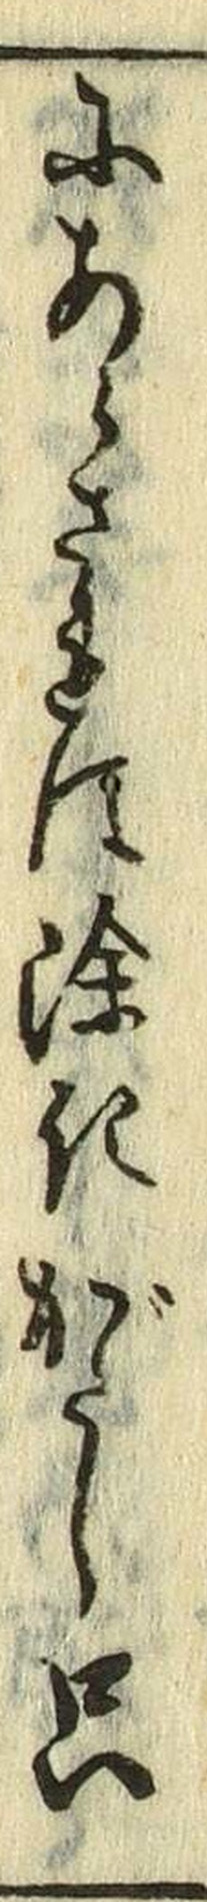にあらされは除きがたし只
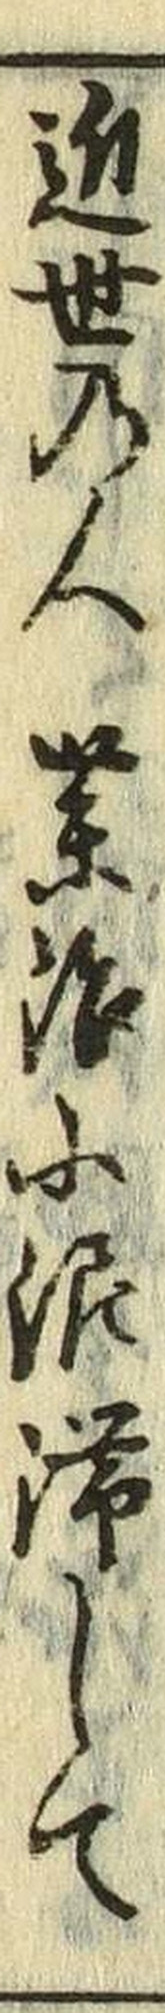近世の人薬治に泥滞して
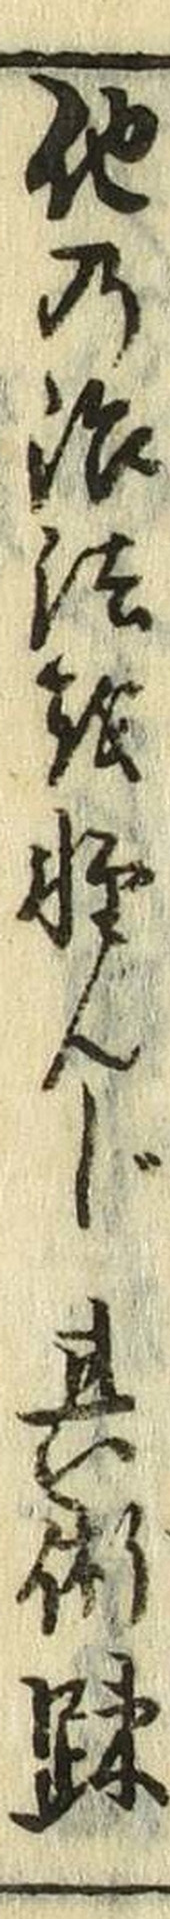他の治法を軽んじ其術疎
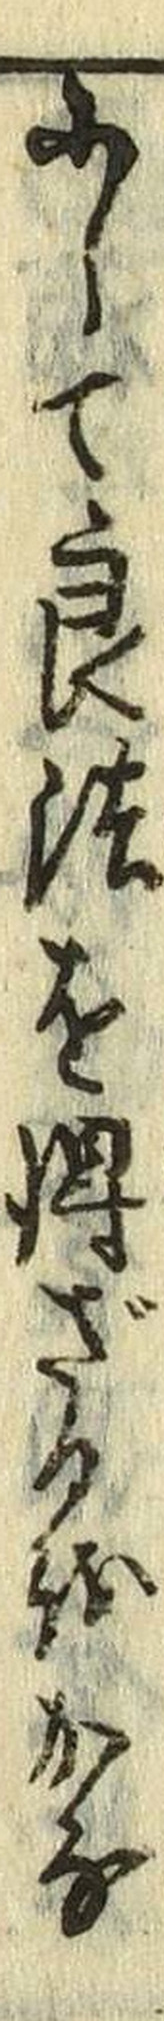にして良法を得ざるをかな
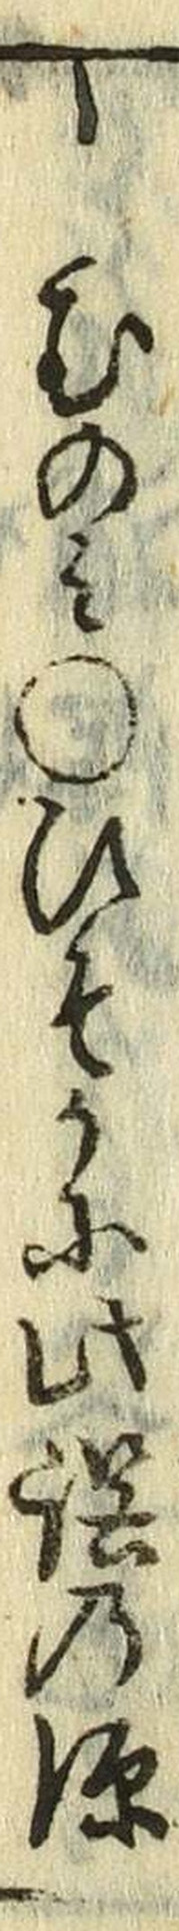しむのみ○ひそかに此誤の源
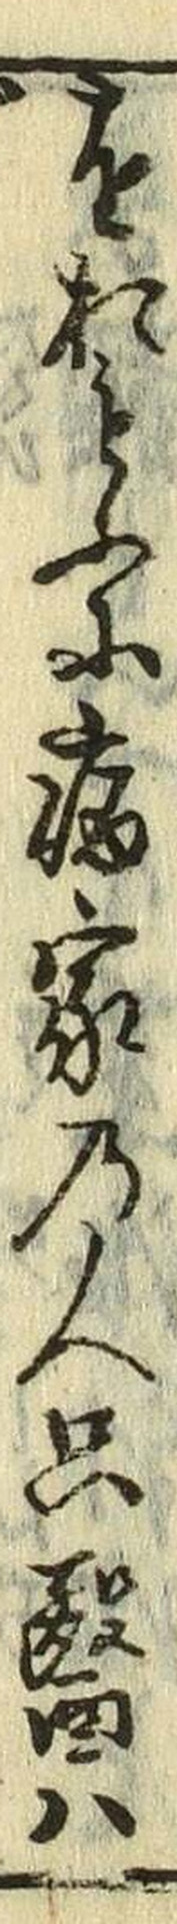をおもふに病家の人只医は
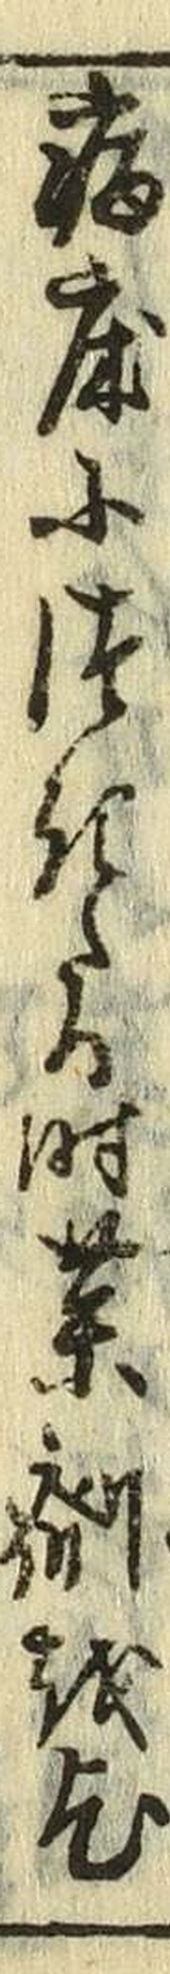病床につきたる時薬剤を乞
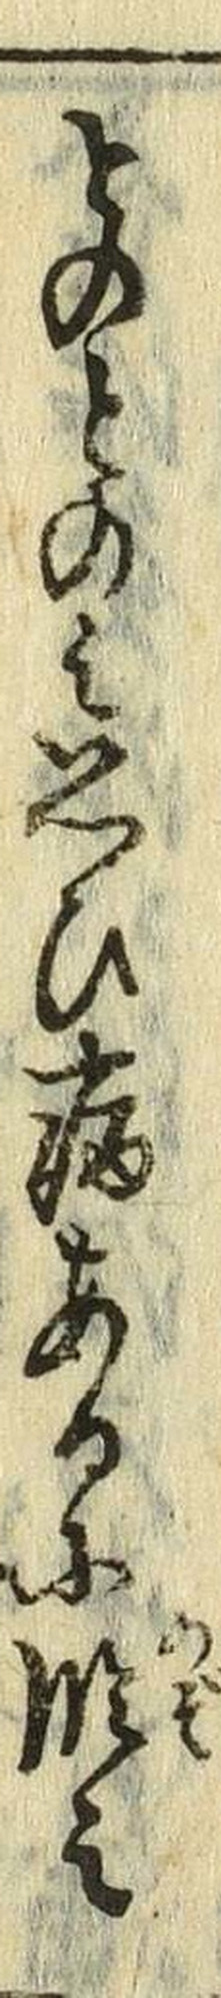ものとのみ思ひ病あるに臨み
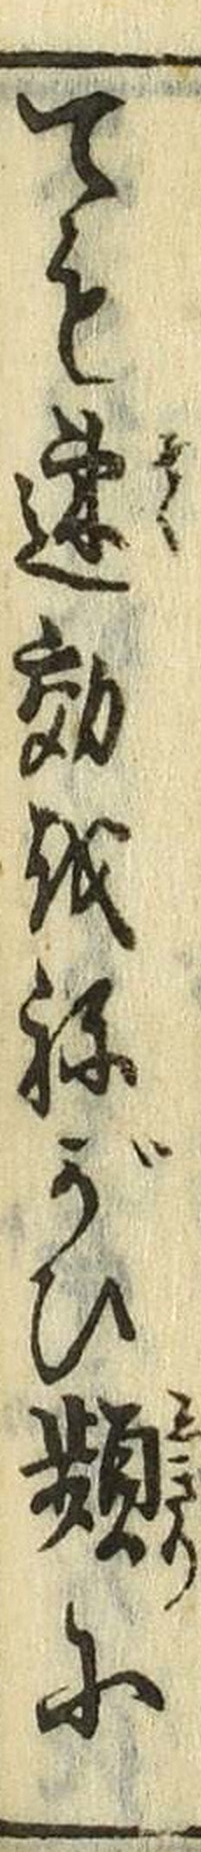ても速効をねがひ頻に
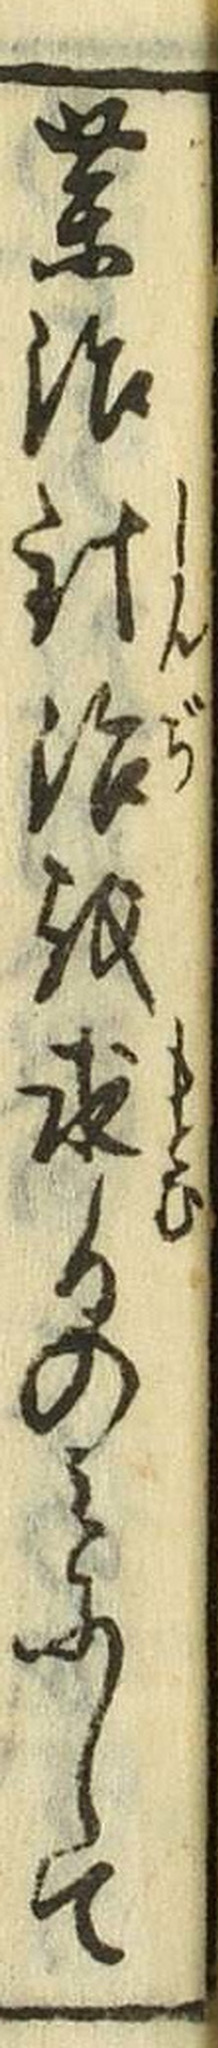薬治針治を求るのみにして
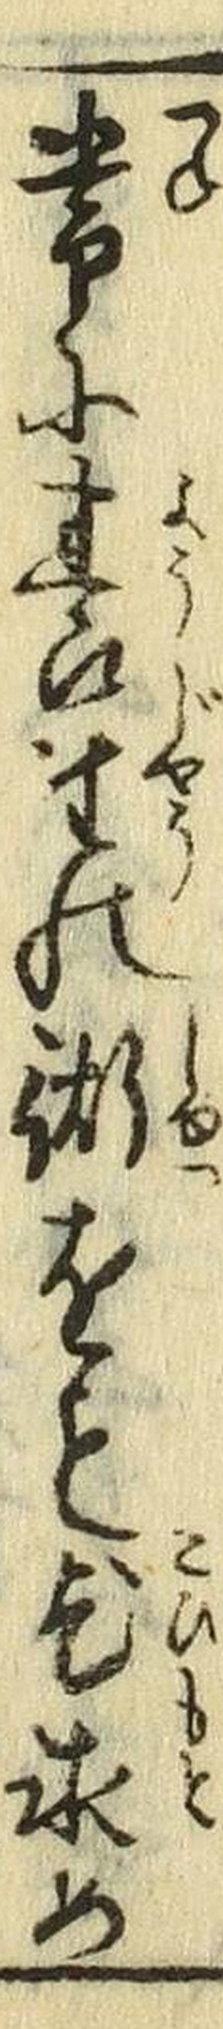常に養生の術をも乞求め
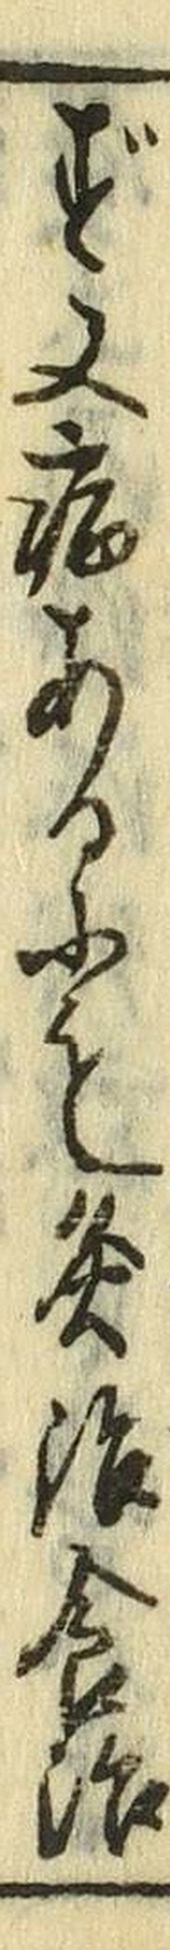ず又病あるにも灸治食治
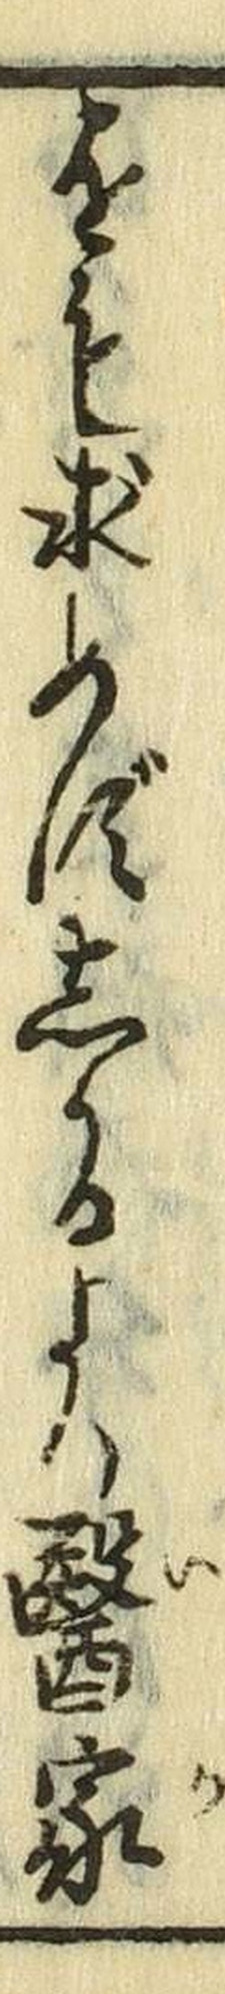をも求めずしかるより医家
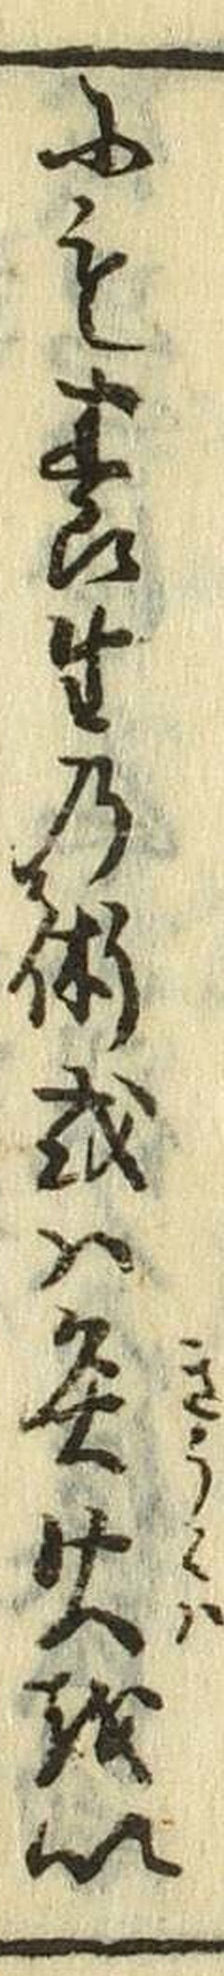にも養生の術或は灸火を以
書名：居家養生記
